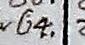64.
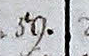59.
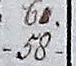58
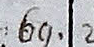69.
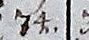74.
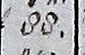88
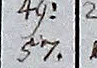57.
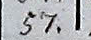57.
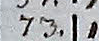73.
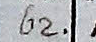62.
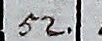52.
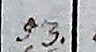53.
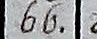66.
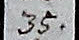35
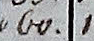60.
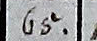65.
